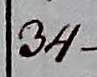34
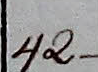42
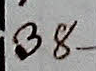38
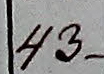43
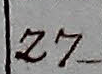27
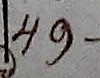49
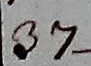37
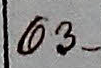63
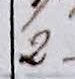2
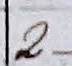2
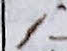1
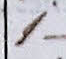1
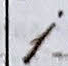1
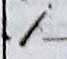1
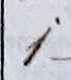1
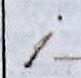1
